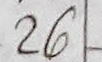26
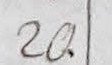20.
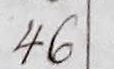46
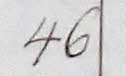46
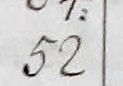52
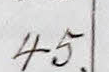45
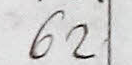62
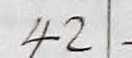42
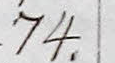74.
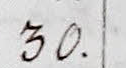30.
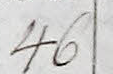46
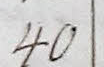40
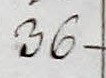36
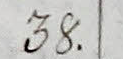38.
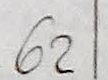62
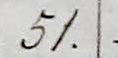51.
